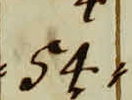54
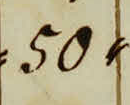50
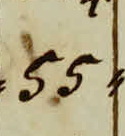55
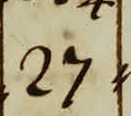27
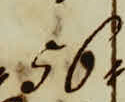56
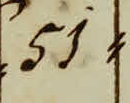51
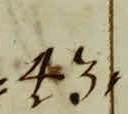43
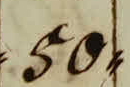50
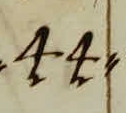44
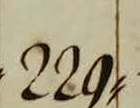229
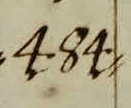484
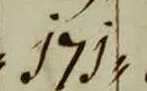171
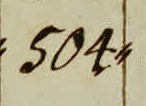504
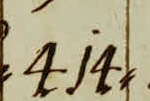414
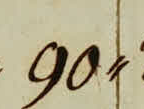90
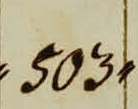503
